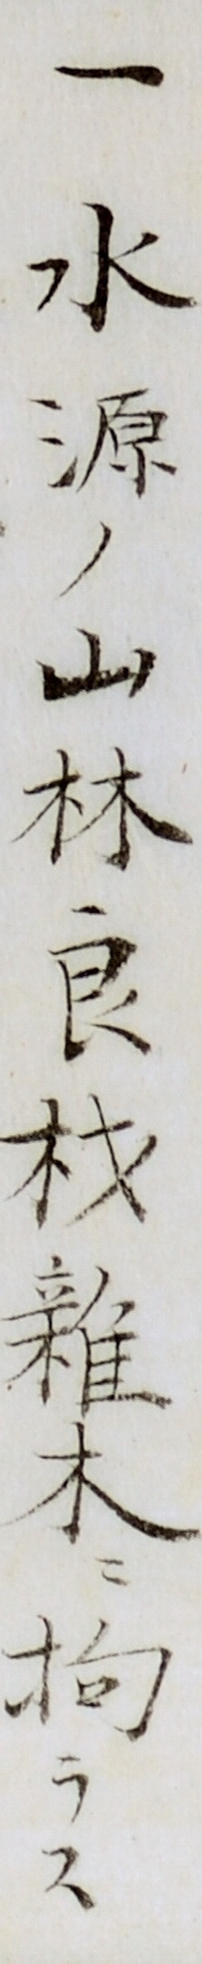一水源ノ山林良材雑木ニ拘ラス
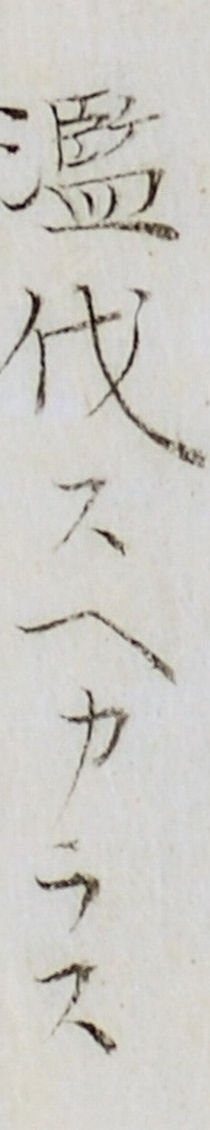濫伐スヘカラス
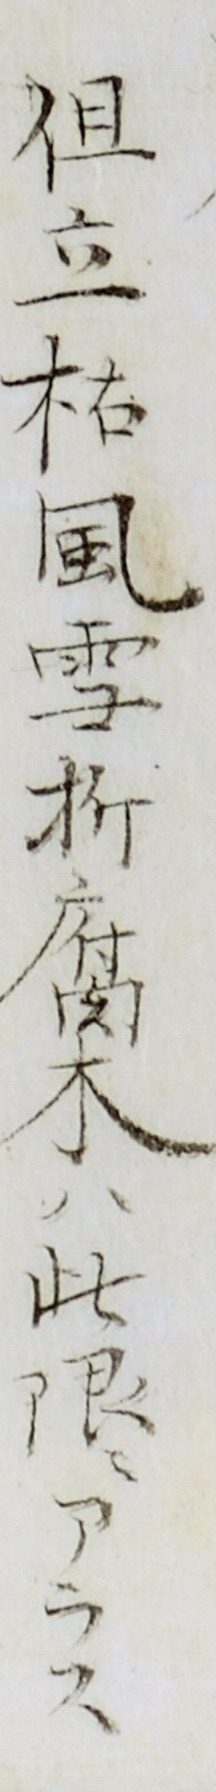但立枯風雪折腐木ハ此限ニアラス
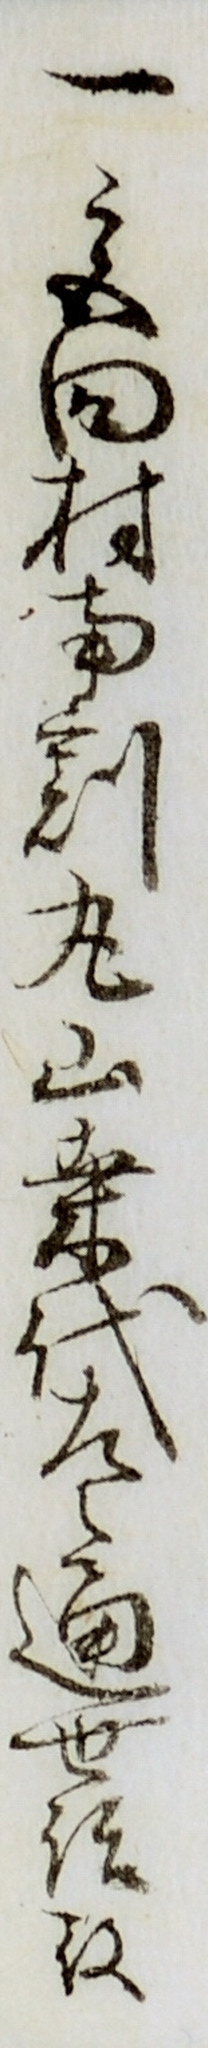一宮田村南割丸山桑代左之通世話役
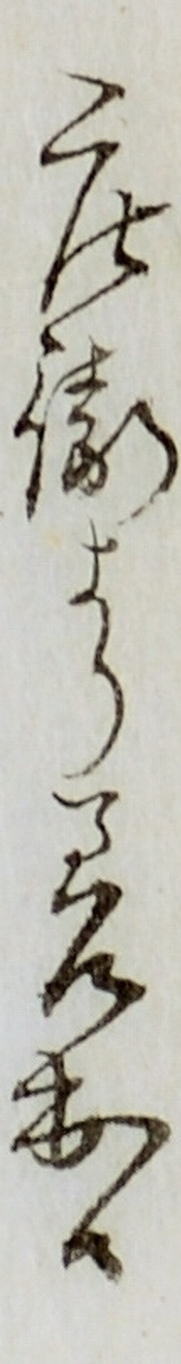庄衛より差出候
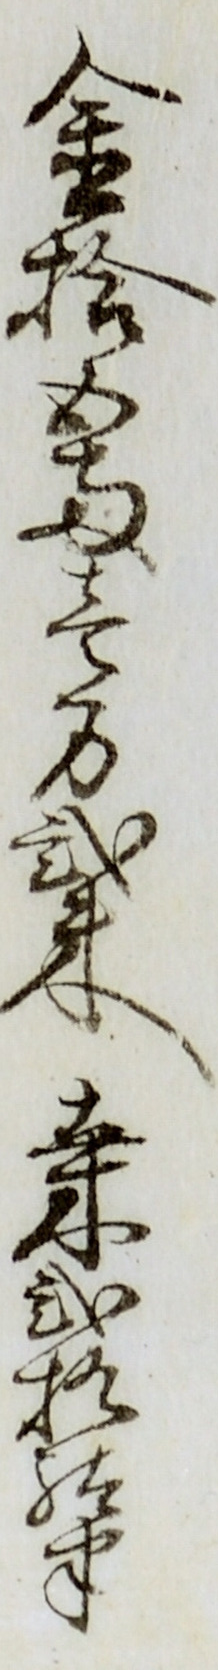金拾五両壱分弐朱桑弐拾駄半
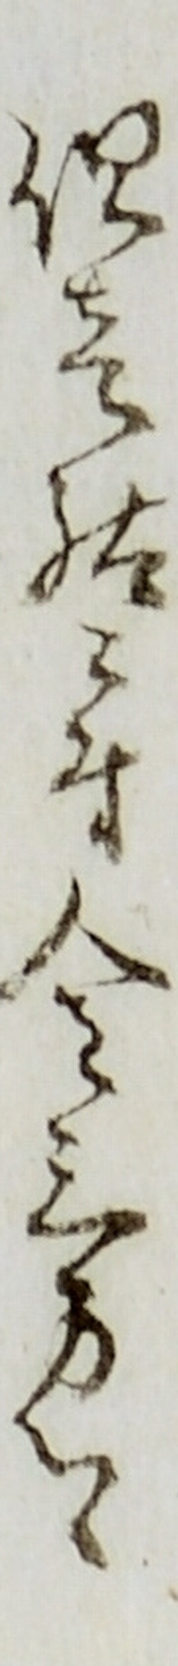但壱駄に付金三分ツヽ
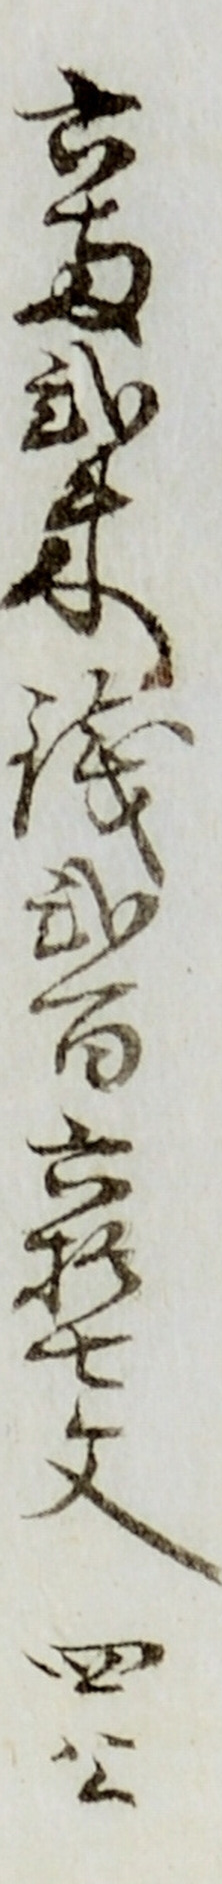六両弐朱銭弐百六拾七文四公
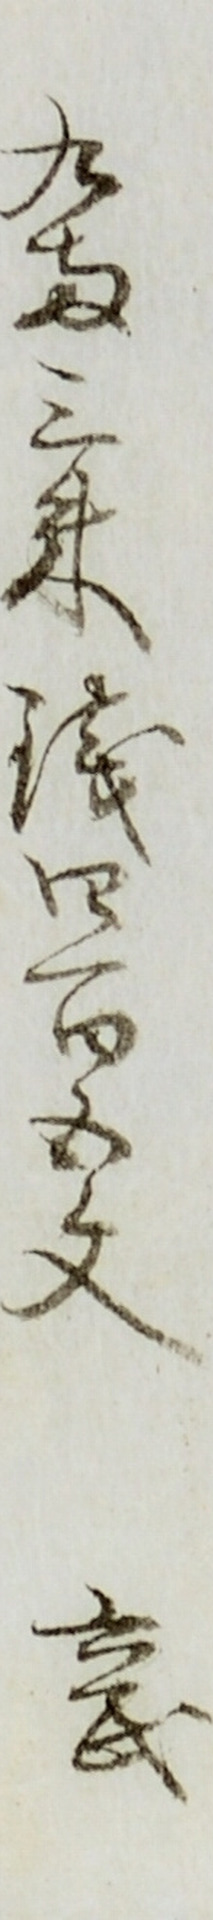九両三朱銭四百五文六民
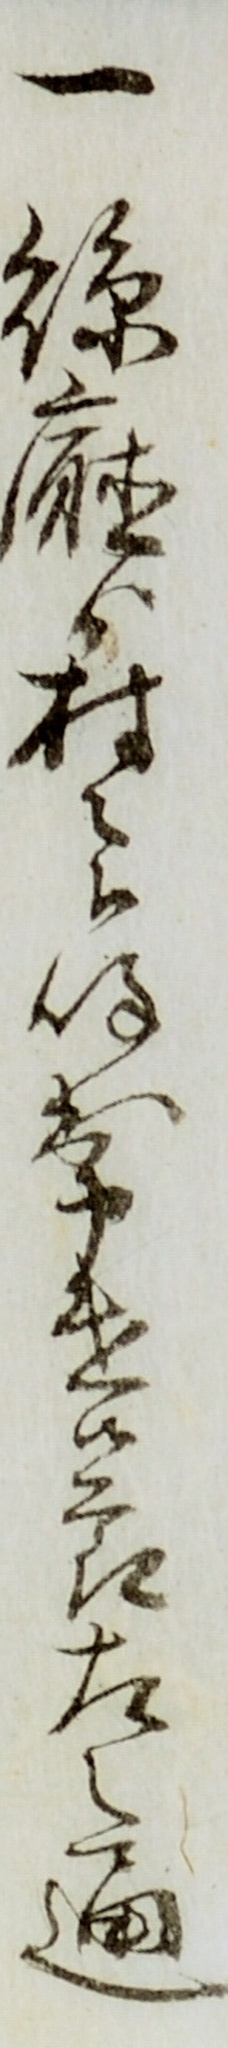一県庁ゟ村々え呼出申遣候節左之通

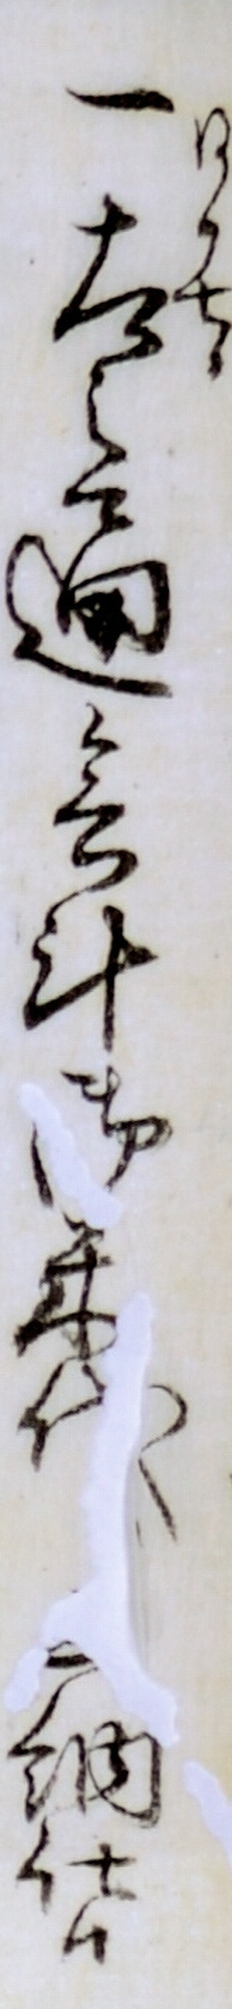一左之通会計御米代納仕候
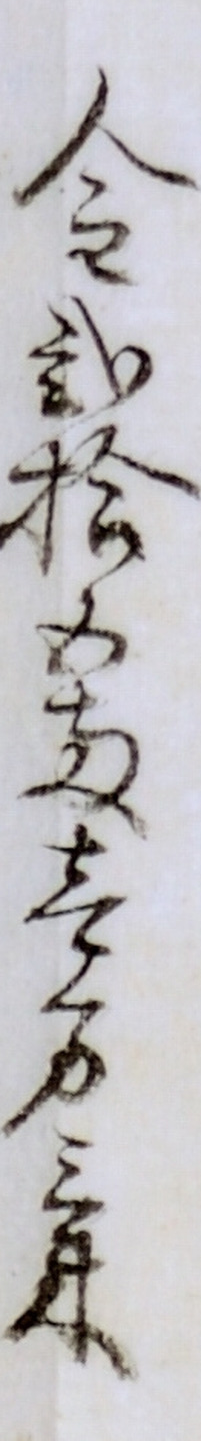金弐拾五両壱分三朱
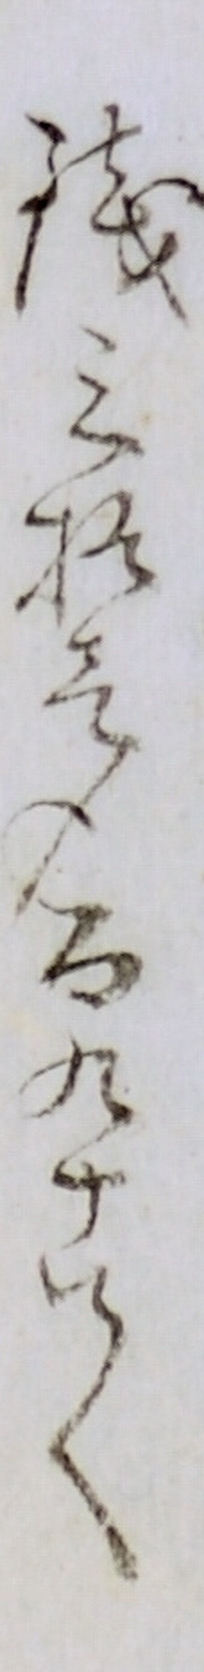銭三拾壱貫百九十文
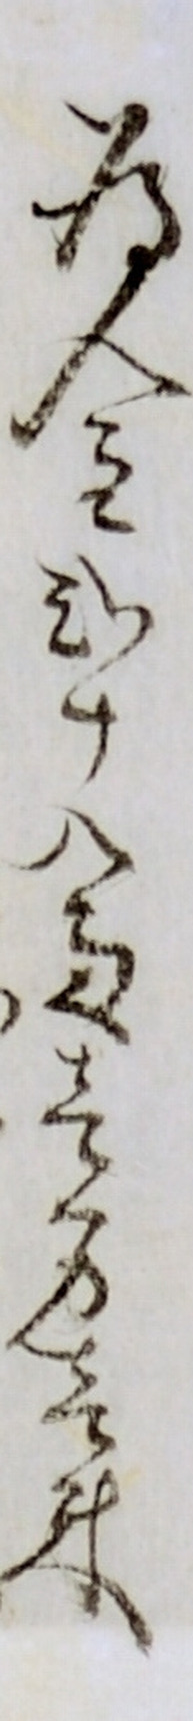為金弐拾八両壱分壱朱
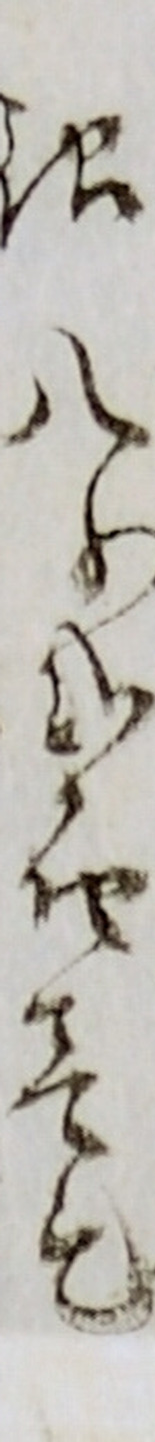銀八分弐厘壱毛
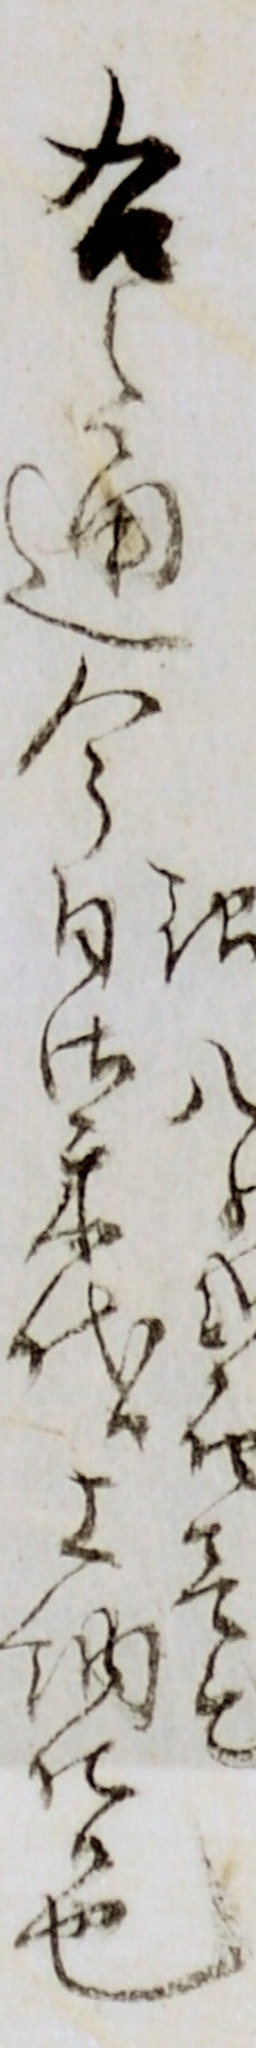右之通今日御米代上納仕候也
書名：山林方諸事御用留
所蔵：伊那市立高遠町図書館・合同会社AMANE
